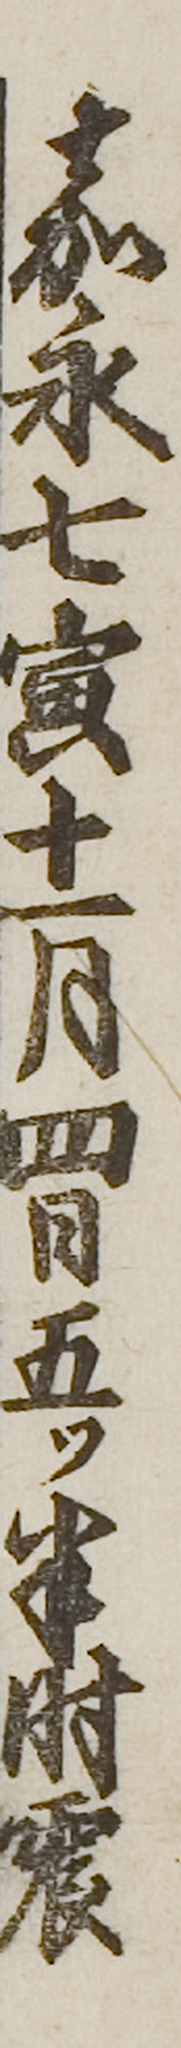嘉永七寅十一月四日五ツ半時震
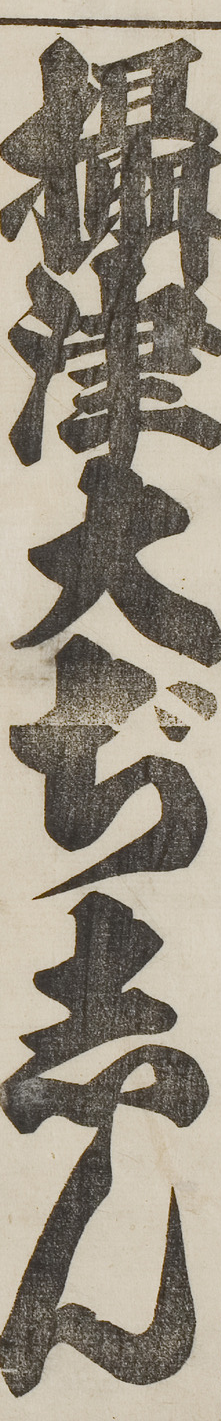摂津大ぢしん
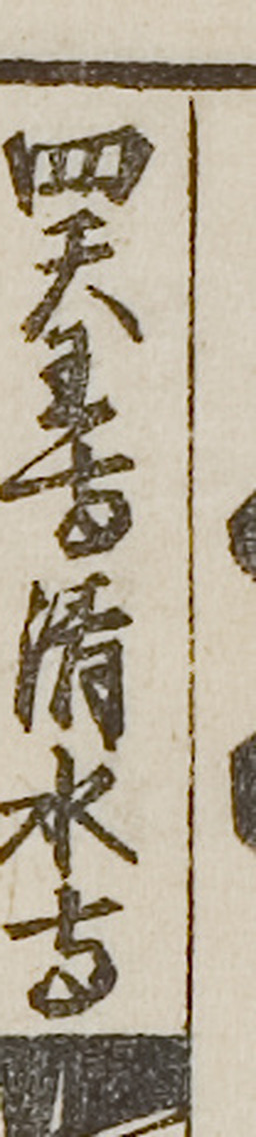四天王寺清水寺
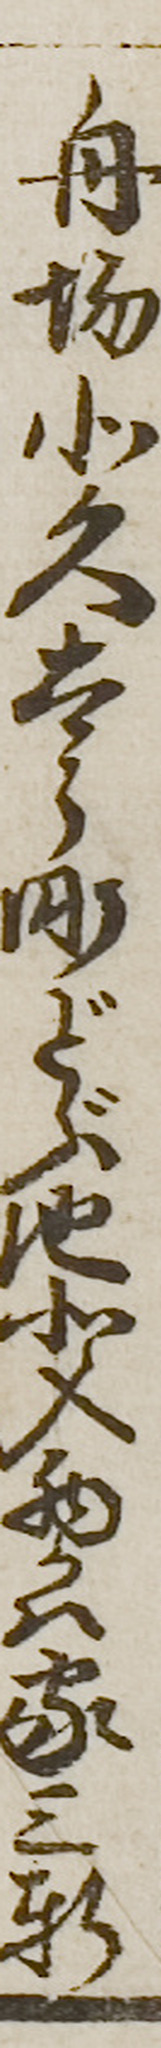舟場北久太郎町どぶ池北入西かは家三軒
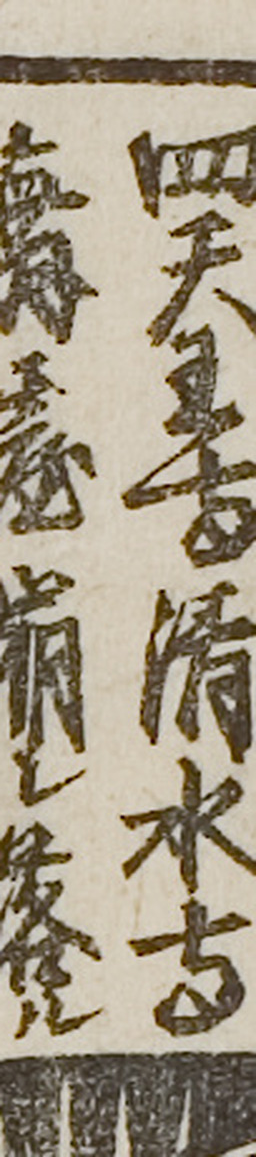舞台崩れ落る
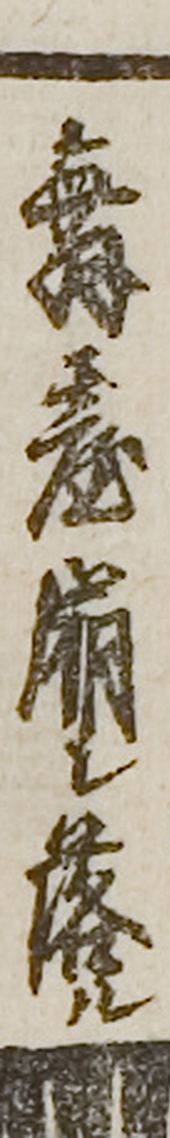舞台崩れ落る
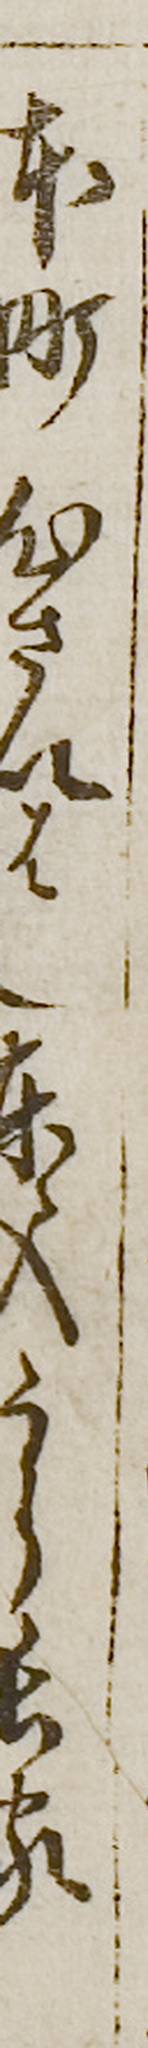本町心さいはし東入うら長屋
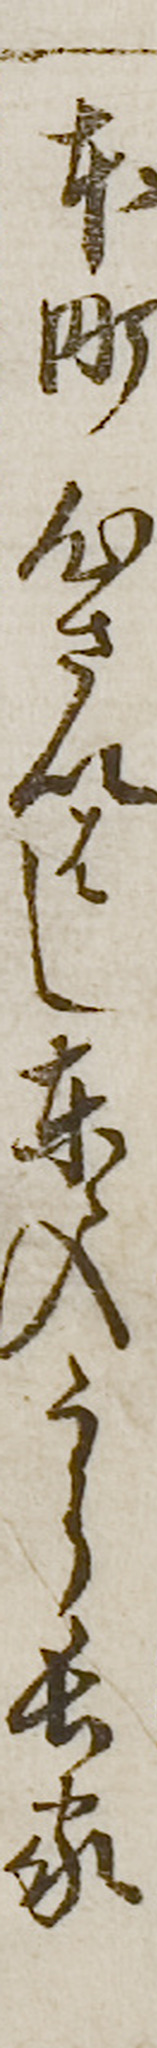本町心さいはし東入うら長屋
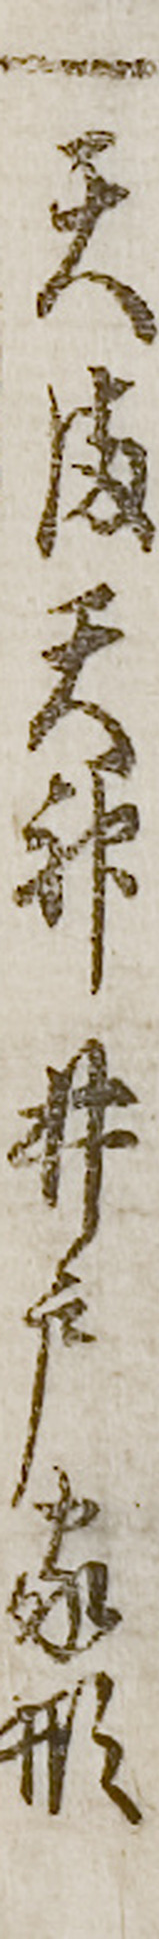天満天神井戸家形
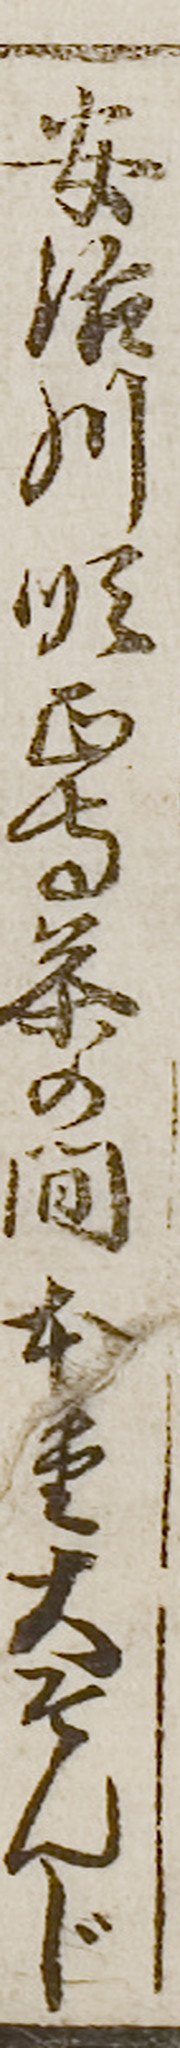安治川順正寺茶の間本堂大そんじ
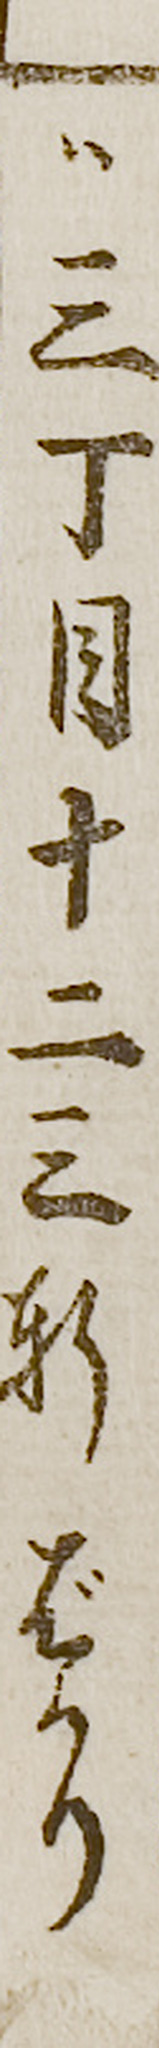〃三丁目十二三軒ばかり
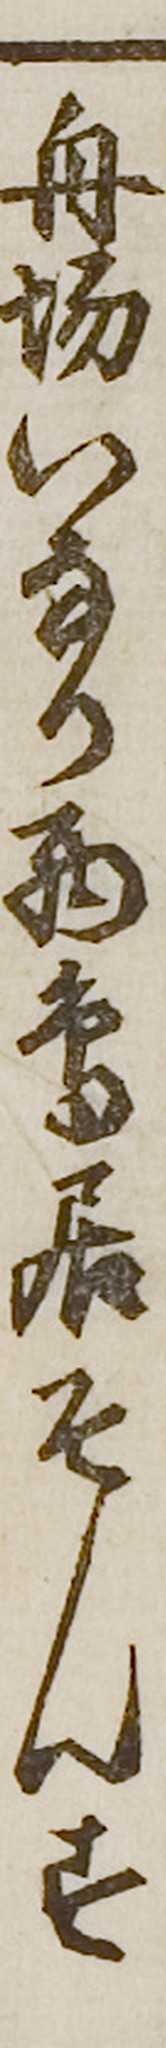舟場いなり西鳥居そんす
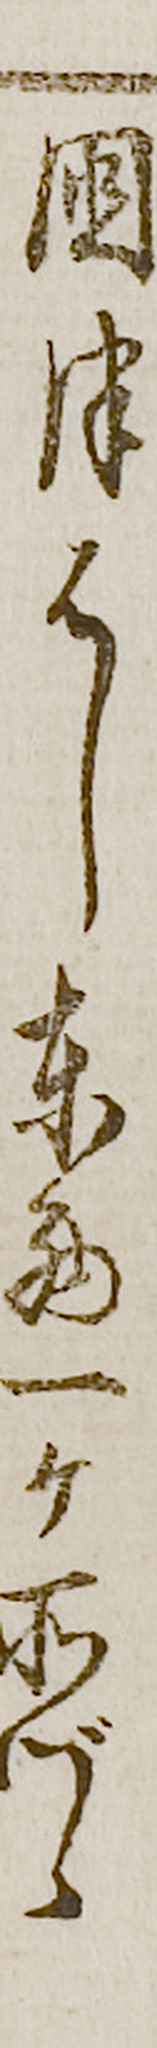国津はし東西一ヶ所づゝ
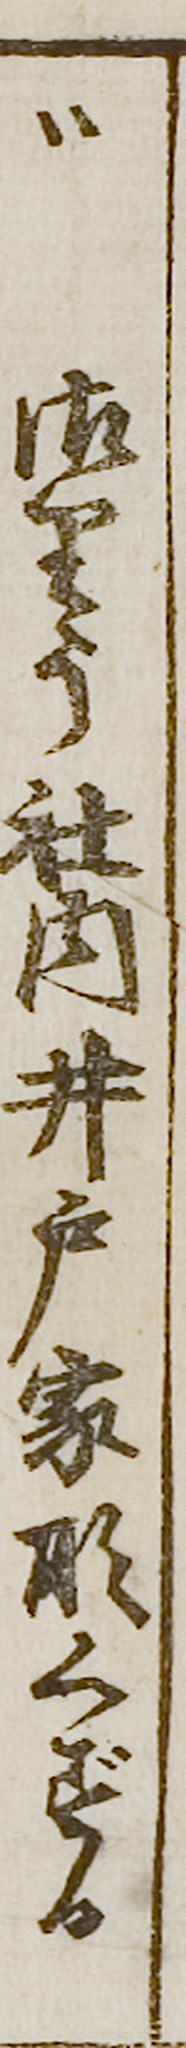〃御りう社内井戸家形くずる
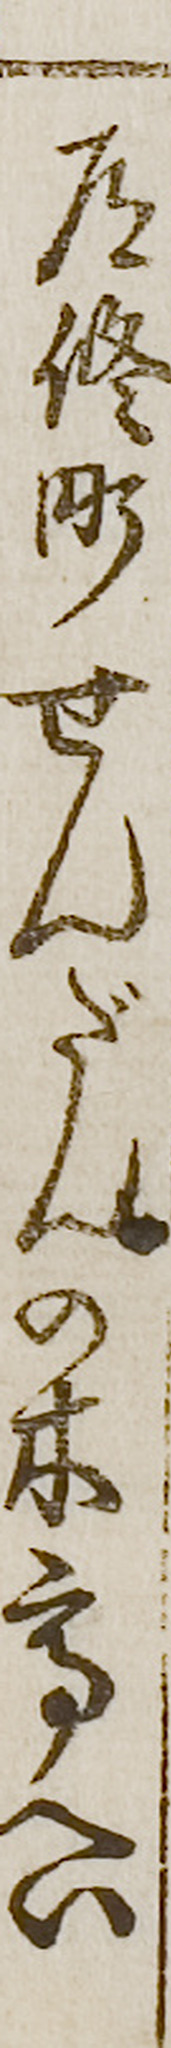道修町せんだんの木高へい
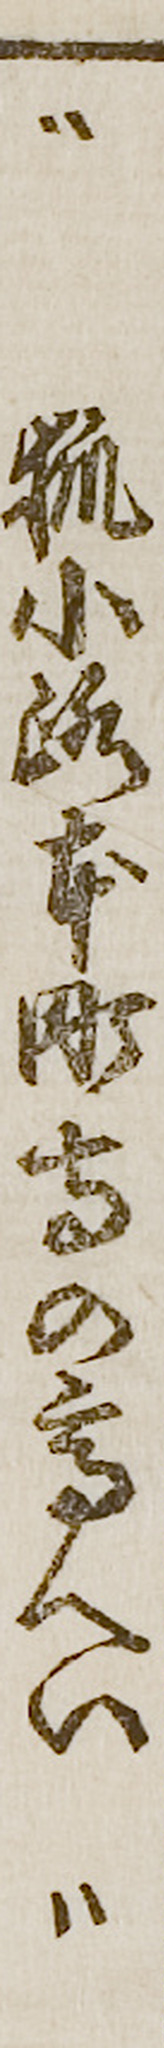〃狐小路本町寺の高へい〃
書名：摂津大ぢしん
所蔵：東京大学総合図書館 General Library in the University of Tokyo, JAPAN
